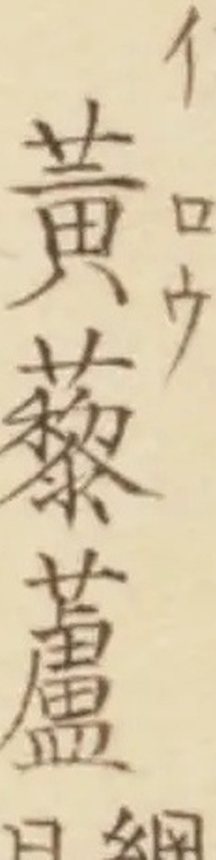木藜蘆
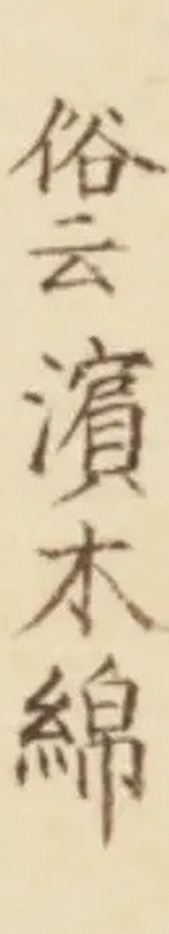俗云濱木綿
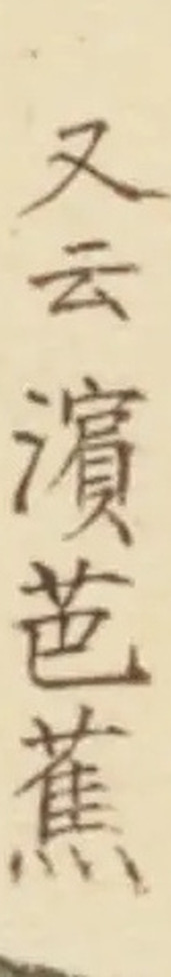又云濱芭蕉
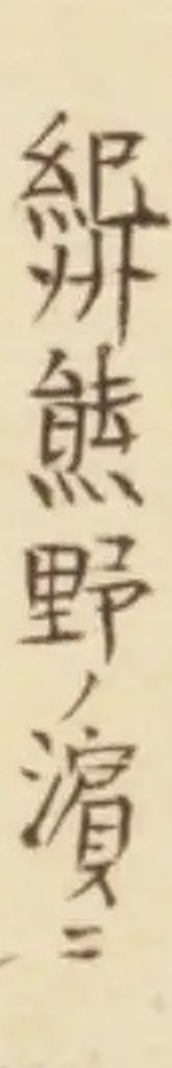紀州熊野ノ濱ニ
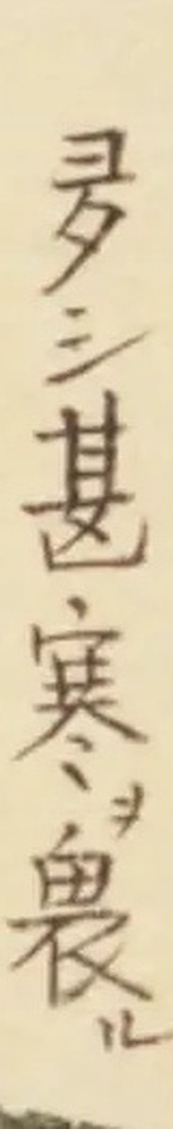夛シ甚ダ寒ヲ畏ル
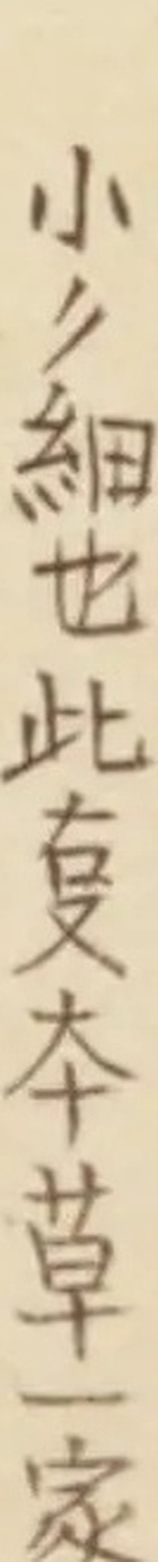小ク細也此夏本草一家
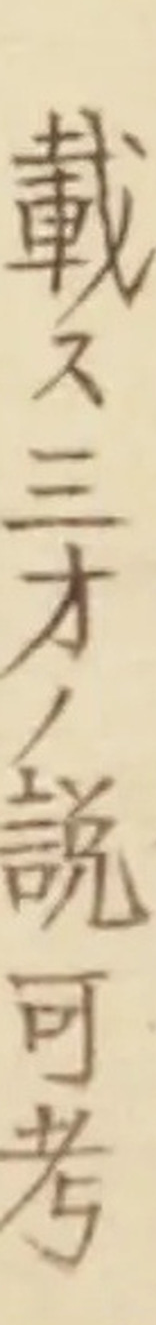載ス三才ノ説可考
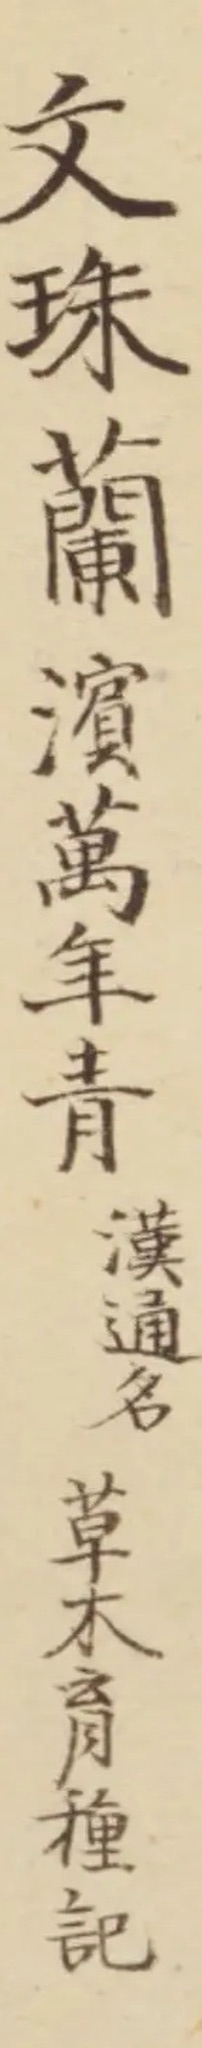文珠蘭濱萬年青漢通名草木育種記
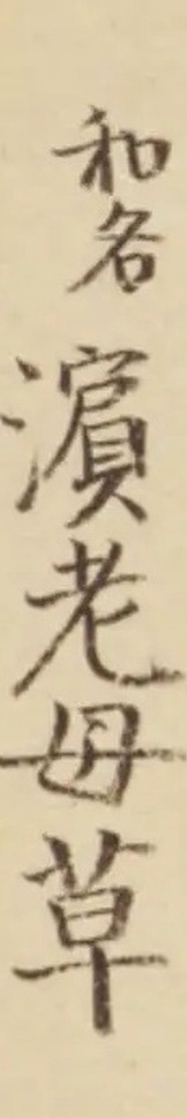和名濱老母草
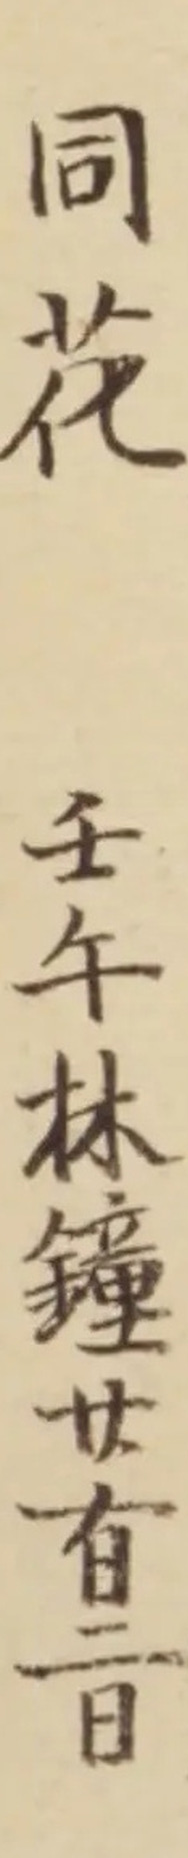同花壬午林鐘廿有二日

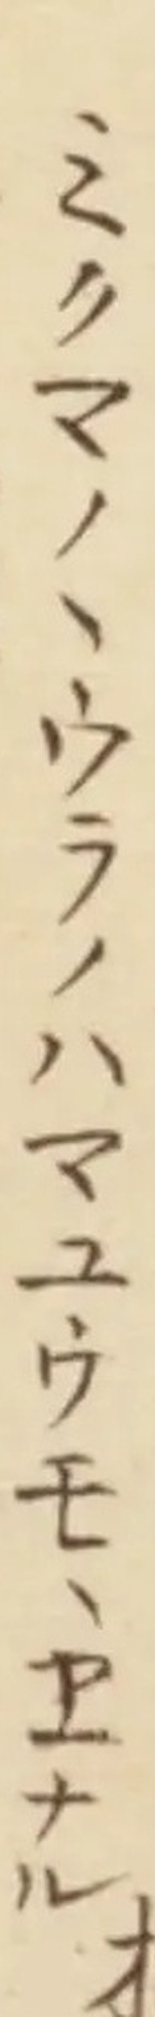ミクマノヽウラノハマユウモヽエナル
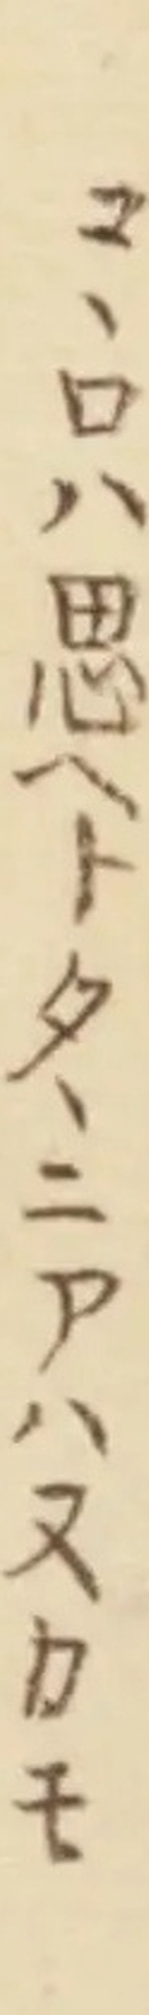コヽロは思ヘトタヽニアハヌカモ
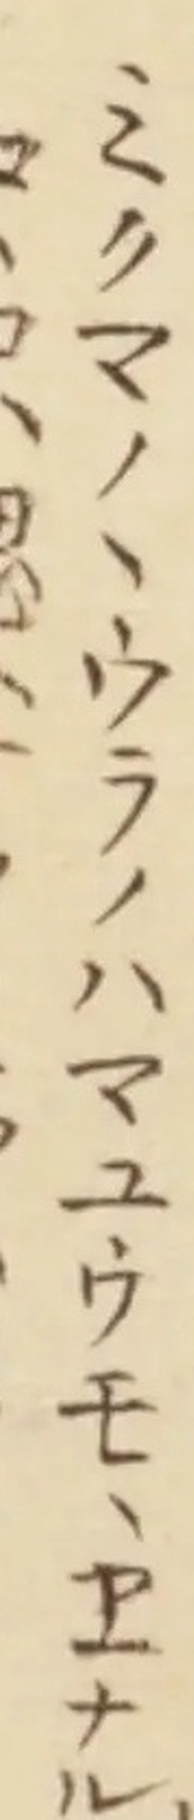ミクマノヽウラノハマユウモヽエナル
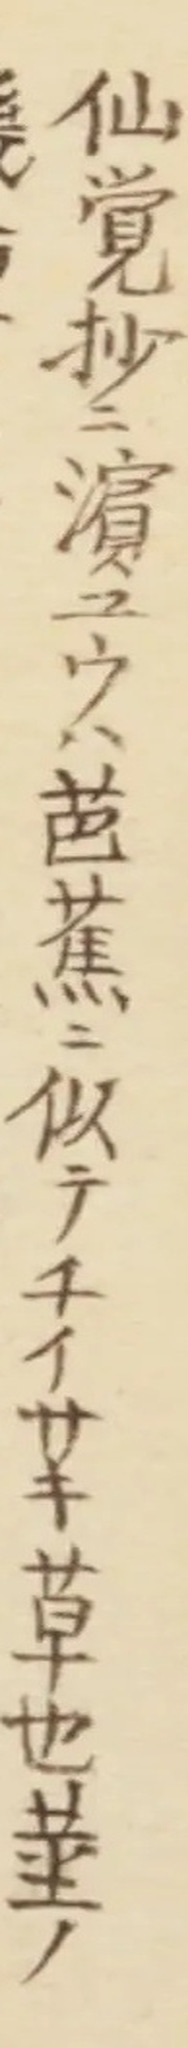仙覚抄ニ濱ユウハ芭蕉ニ似テチイサキ草也莖ノ
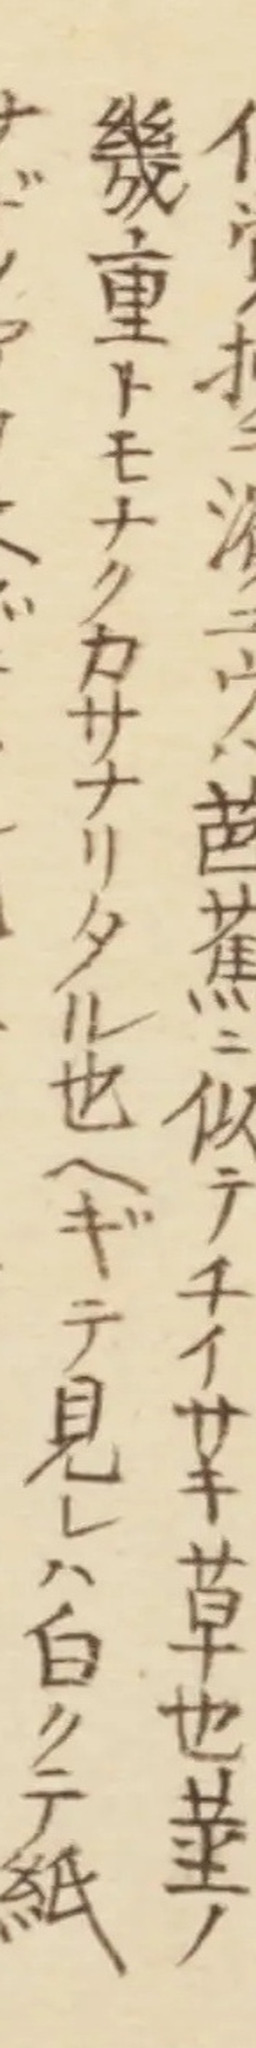幾重トモナクカサナリタル也ヘギテ見レバ白クテ紙
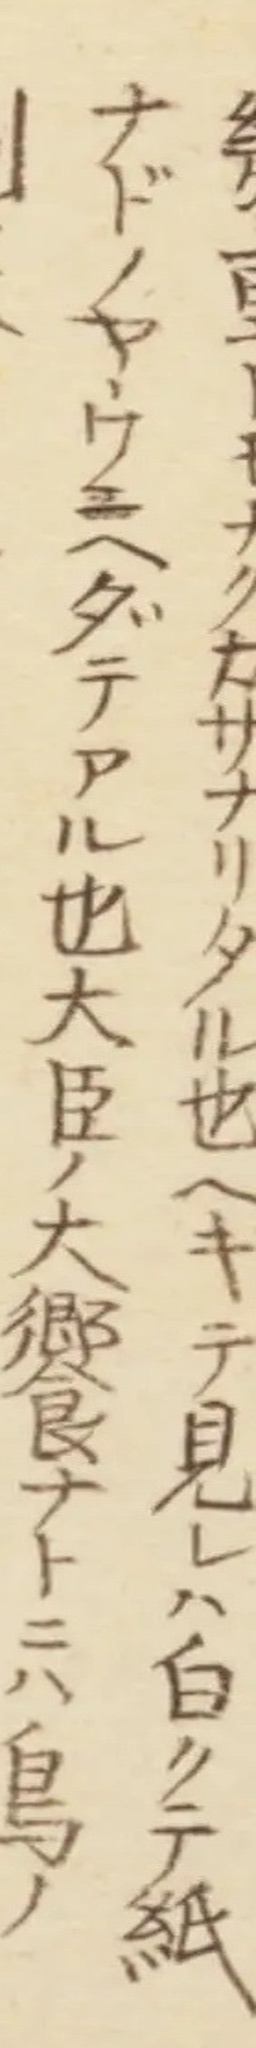ナドノヤウニヘダテアル也大臣ノ大饗ナトニハ鳥ノ
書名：梅園草木花譜夏之部. 1
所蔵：国立国会図書館 National Diet Library, JAPAN
